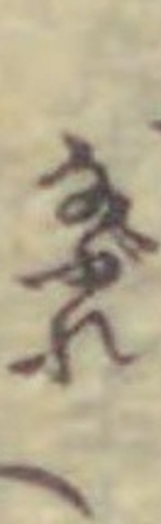なぶれ
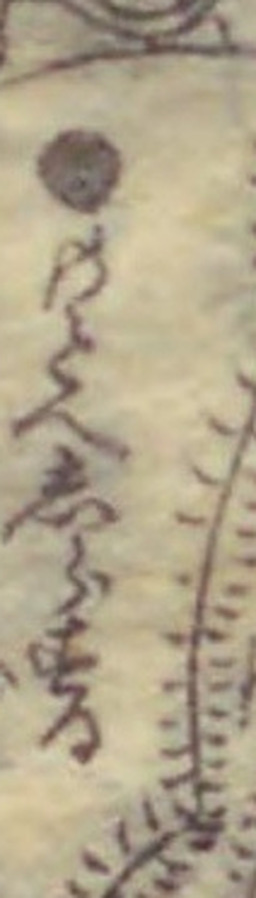●もとへしらする
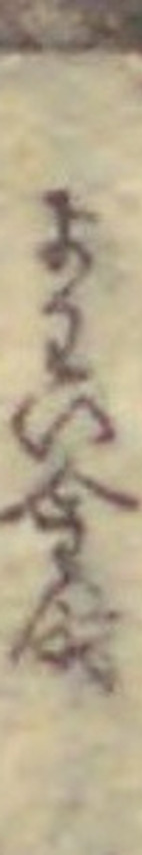よわい金時
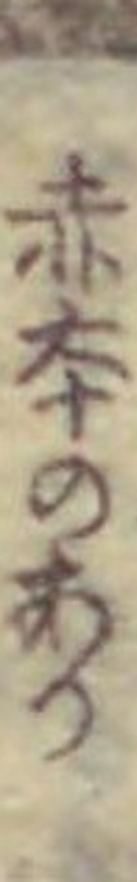赤夲のあか
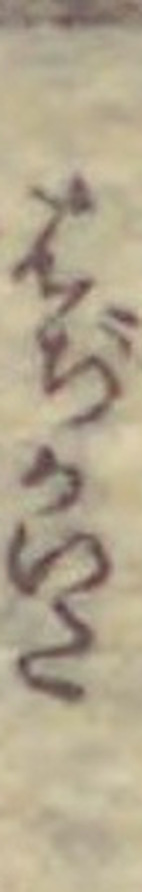はぢかいた
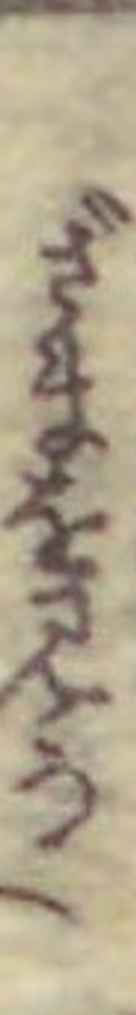ざまを見ろ
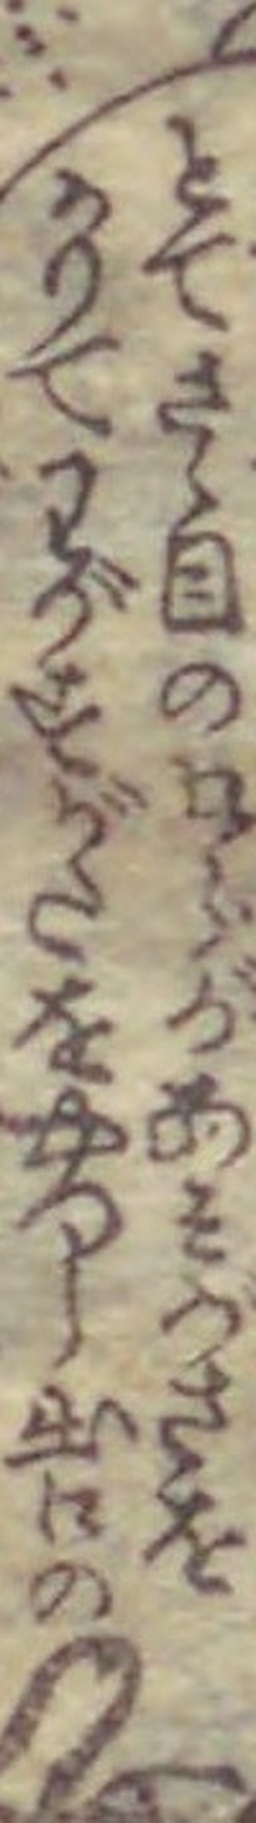かりてわがすがたをやつし出口の
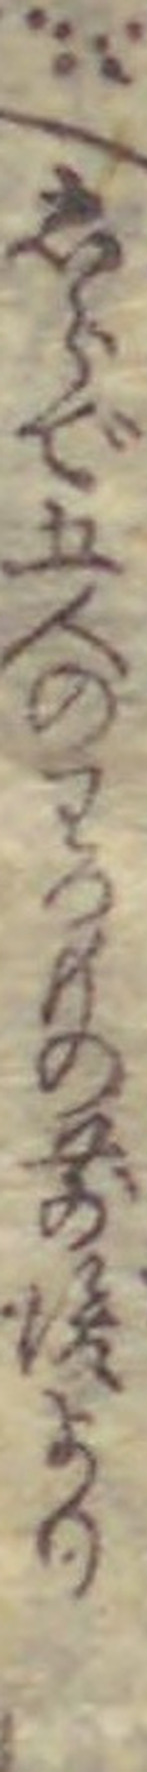しらで五人のわかもの前後より
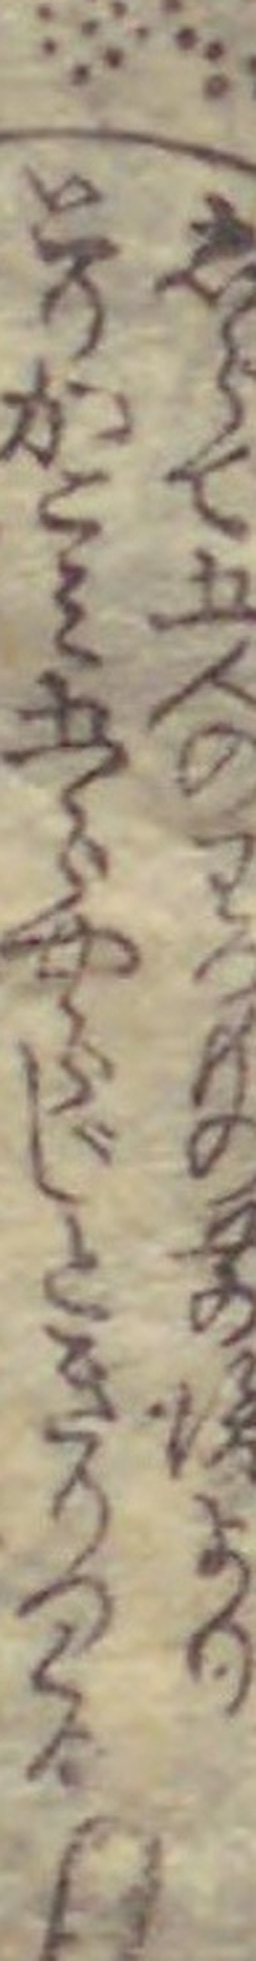とりかこみ五郎やらじときりつくる
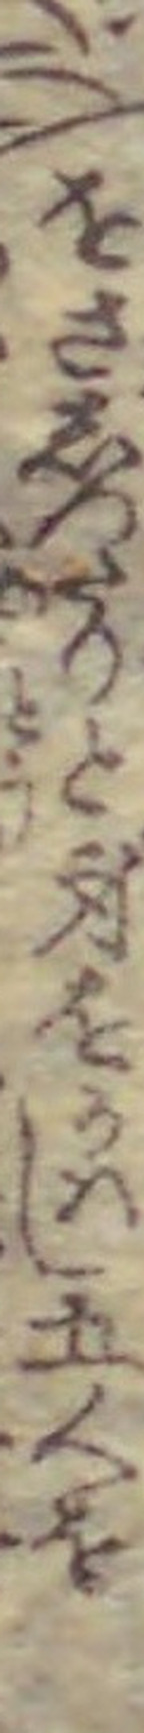をさしつたりと身をかはし五人を
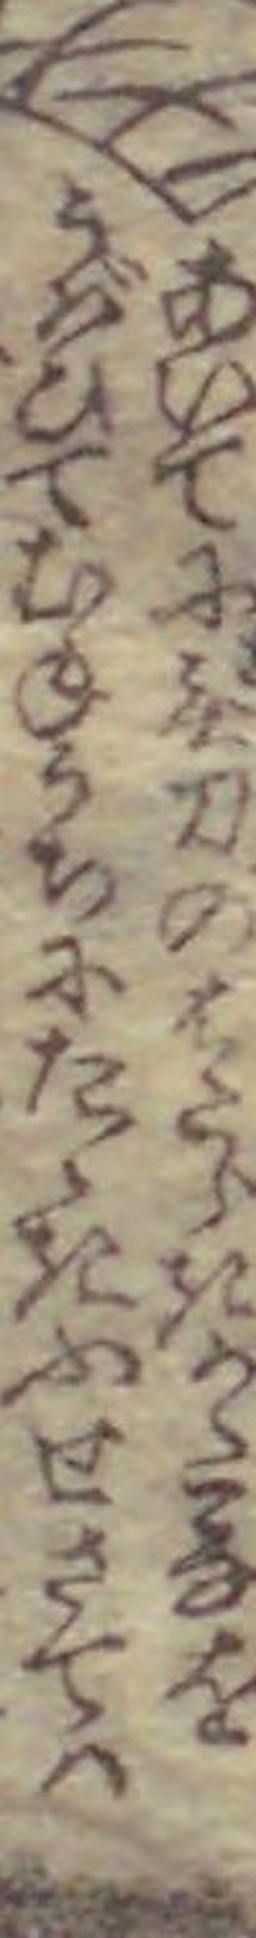うばひてむねうちにたゝきふせさては
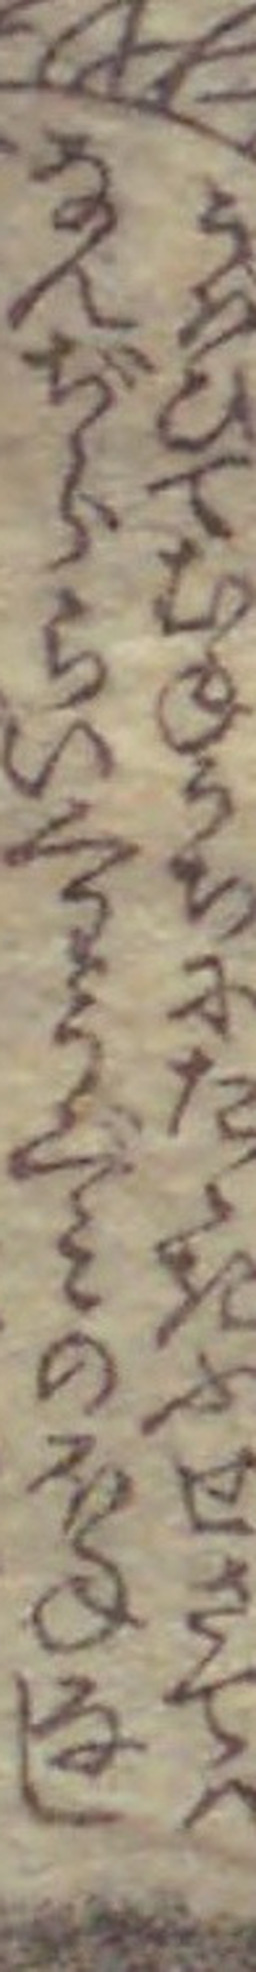なんぢららいくわうぐみのほねなし
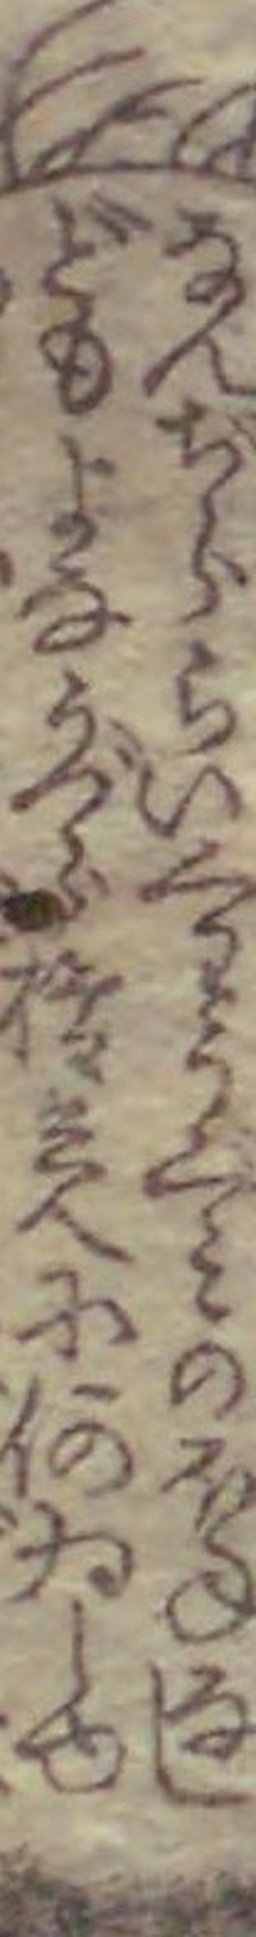どもよなうづら権兵へに何ゐしゆ
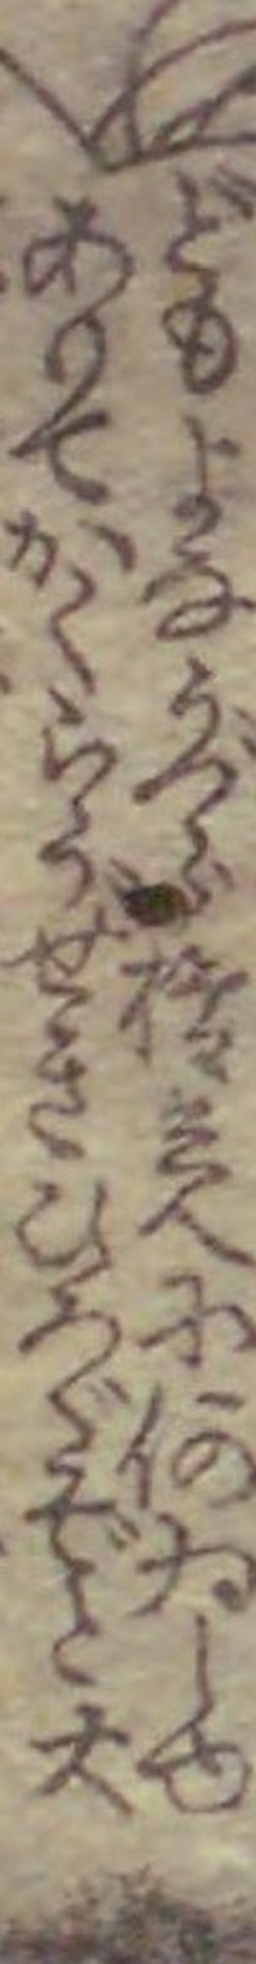ありてかくらうぜきひろぐぞと大
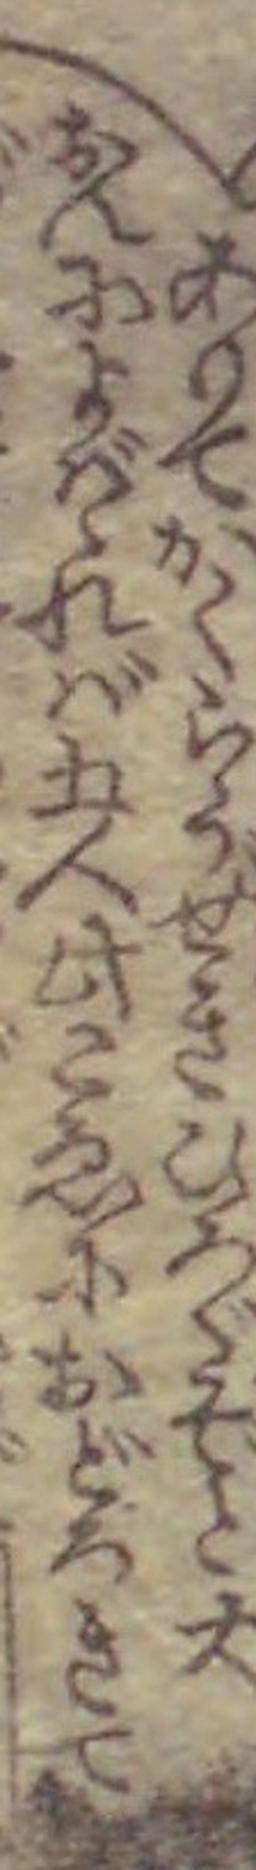おんによばゝれば五人此こゑにおどろきて

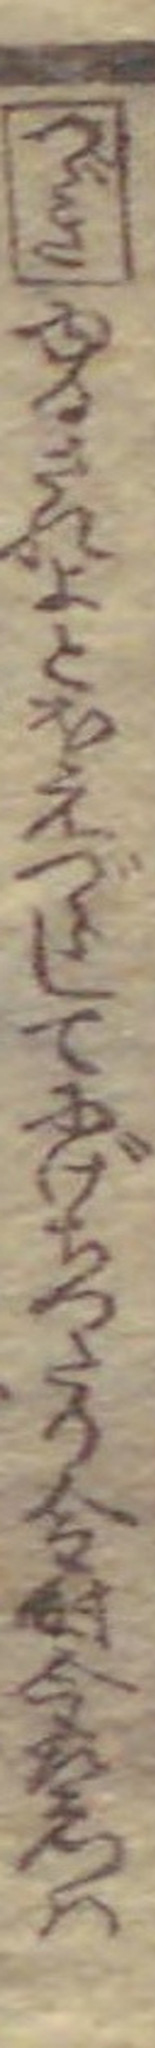「つづき」ゆるされよとほえづらしてにげちつたり金時金左衛門は
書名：八ツ目鱣因縁物語 3巻
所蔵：国立国会図書館 National Diet Library, JAPAN
